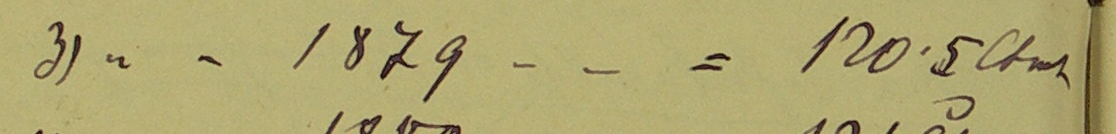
3) 1879 = 120,5 ctmtr
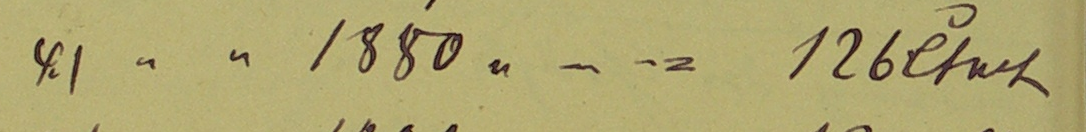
4) 1880 = 126 ctmtr
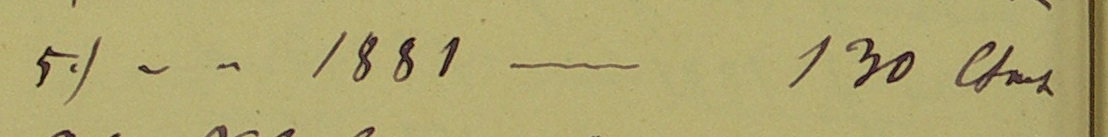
5) 1881 = 130 ctmtr
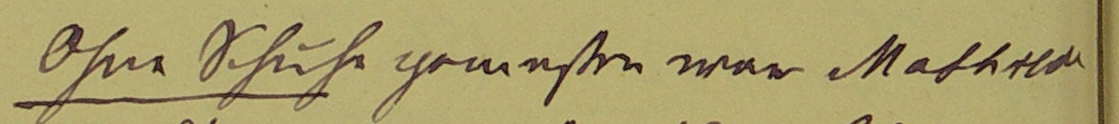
Ohne Schuhe gemeßen war Mathilde
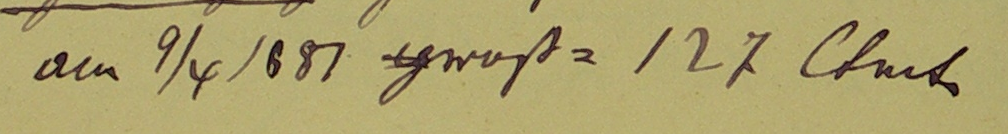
am 9/4 1881 groß = 127 ctmtr
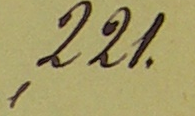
221
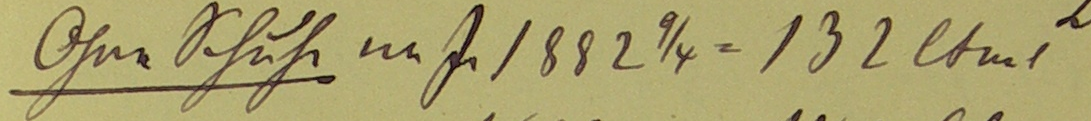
Ohne Schuhe 1882 = 132 ctmtr
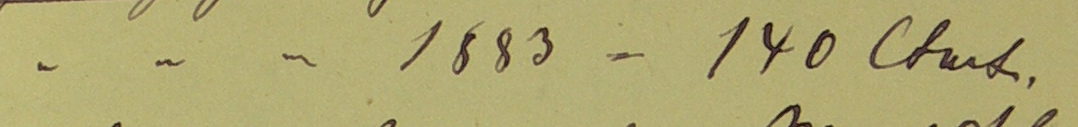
1883 = 140 ctmtr
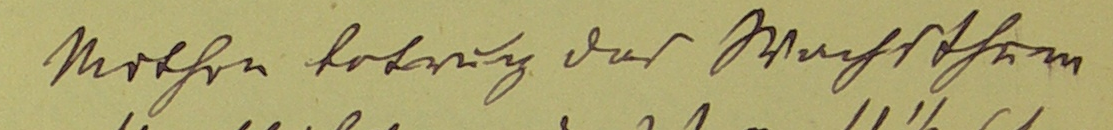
Mithin betrug das Wachstum
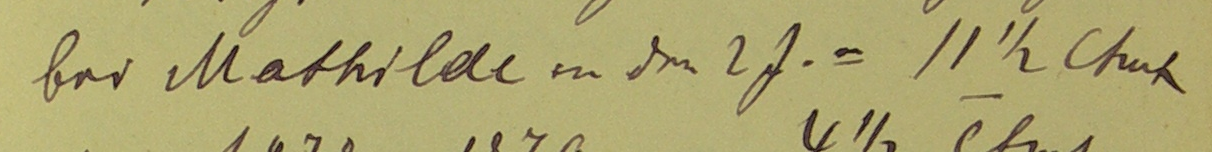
bei Mathilde in den 2 Jahren = 11 ½ ctmtr
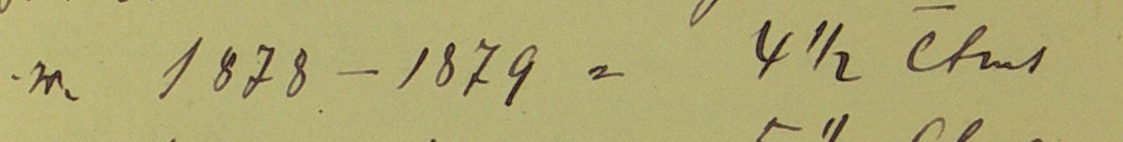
Von 1878-1879 = 4 ½ ctmtr
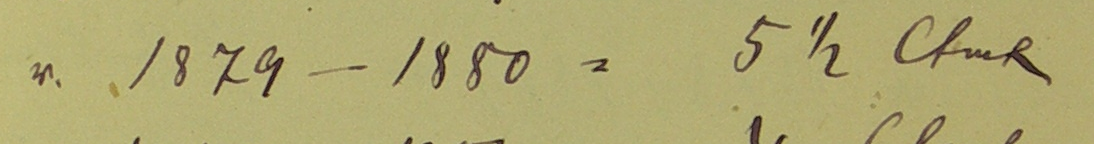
1879-1880 = 5 ½ ctmtr
